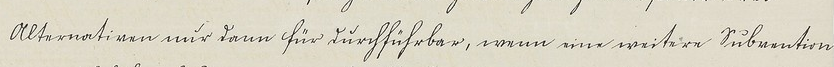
Alternativen nur dann für durchführbar, wenn eine weitere Subvention
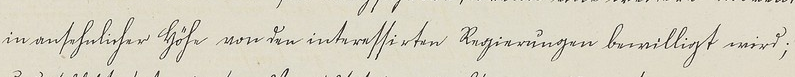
in ansehnlicher Höhe von den interessirten Regierungen bewilligt wird;
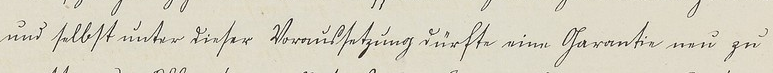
und selbst unter dieser Voraussetzung dürfte eine Garantie neu zu
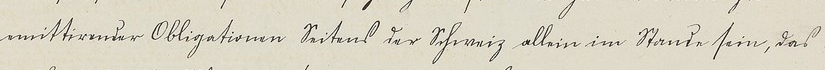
emittirender Obligationen Seitens der Schweiz allein im Stande sein, das
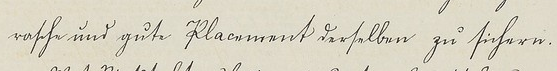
rasche und gute Placement derselben zu sichern.
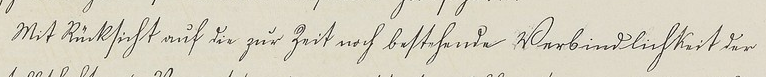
Mit Rücksicht auf die zur Zeit noch bestehende Verbindlichkeit der
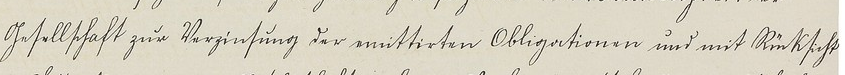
Gesellschaft zur Verzinsung der emittirten Obligationen und mit Rücksicht
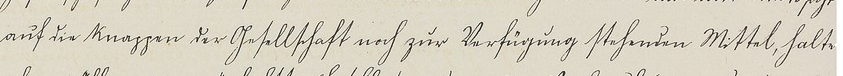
auf die knappen der Gesellschaft noch zur Verfügung stehenden Mittel, halte
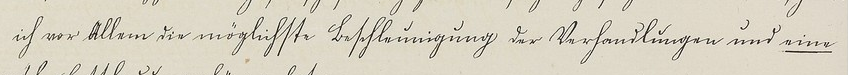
ich vor Allem die möglichste Beschleunigung der Verhandlungen und eine
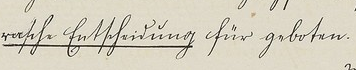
rasche Entscheidung für geboten.
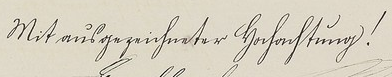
Mit ausgezeichneter Hochachtung!
